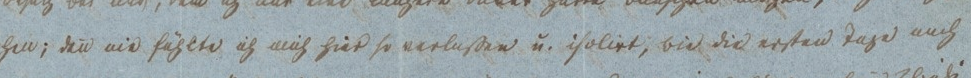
hen; denn nie fühlte ich mich hier so verlassen u. isolirt, wie die ersten Tage nach
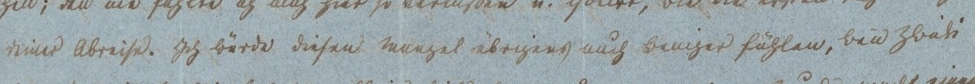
deiner Abreise. Ich würde diesen Mangel übrigens auch weniger fühlen, wenn Zwicki
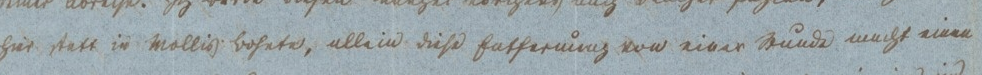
hier statt in Mollis wohnte, allein diese Entfernung von einer Stunde macht einen
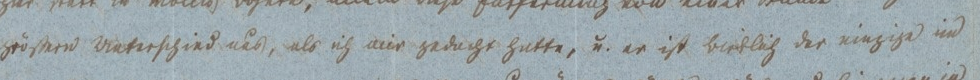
grössern Unterschied aus, als ich mir gedacht hatte, u. er ist wirklich der einzige im
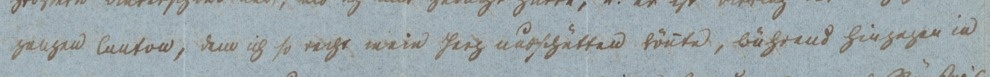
ganzen Canton, dem ich so recht mein Herz ausschütten könnte, während hingegen in
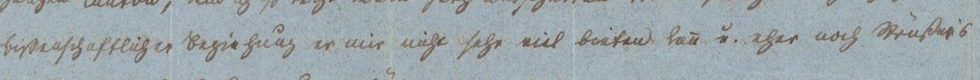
wissenschaftlicher Beziehung er mir nicht sehr viel bieten kann u. eher noch Sträßer's
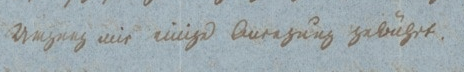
Umgang mir einige Anregung gewährt.
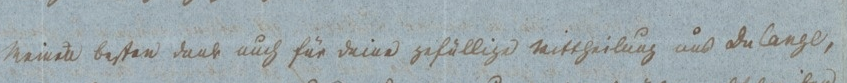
Meinen besten Dank auch für die gefällige Mittheilung aus Du Cange,
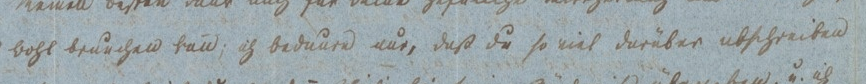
wohl brauchen kann; ich bedaure nur, daß du so viel darüber abschreiben
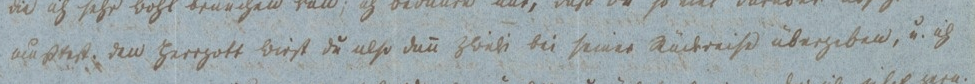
mußtest. Den Herrgott wirst du also dann Zwicki bei seiner Rückreise übergeben, u. ich
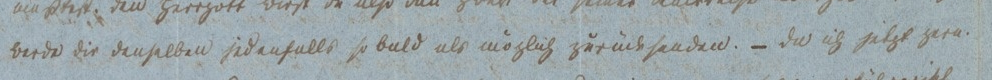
werde dir denselben jedenfalls so bald als möglich zurücksenden. – Da ich jetzt gera-
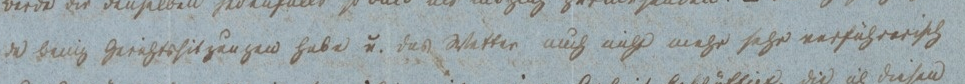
de wenig Gerichtssitzungen habe u. das Wetter auch nicht mehr sehr verführerisch
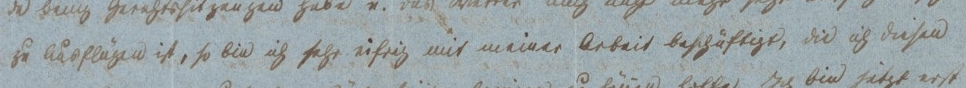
zu Ausflügen ist, so bin ich sehr eifrig mit meiner Arbeit beschäftigt, die ich diesen
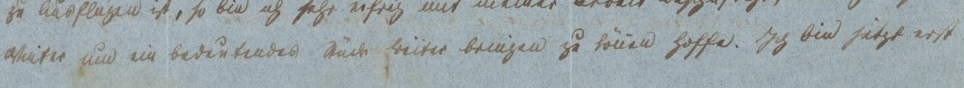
Winter um ein bedeutendes Stück weiter bringen zu können hoffe. Ich bin jetzt erst
